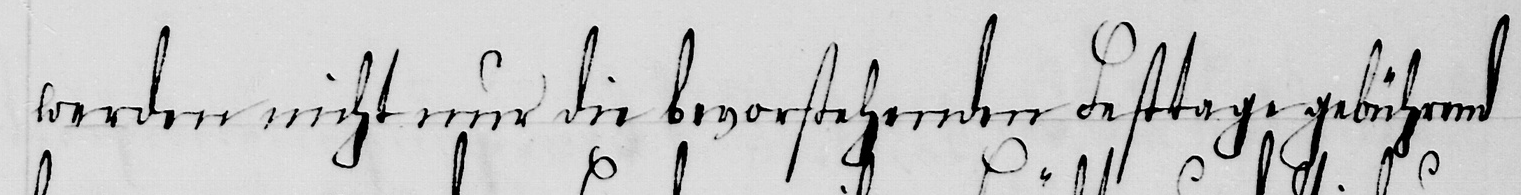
werden nicht nur die bevorstehenden Festtage gebührend
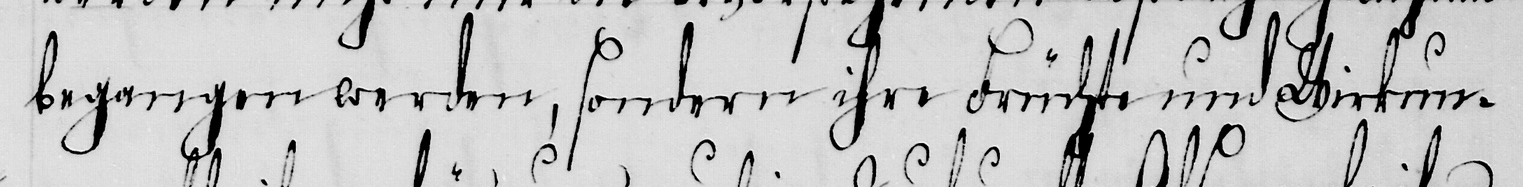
begangen werden, sondern ihre Früchte und Wirkun¬
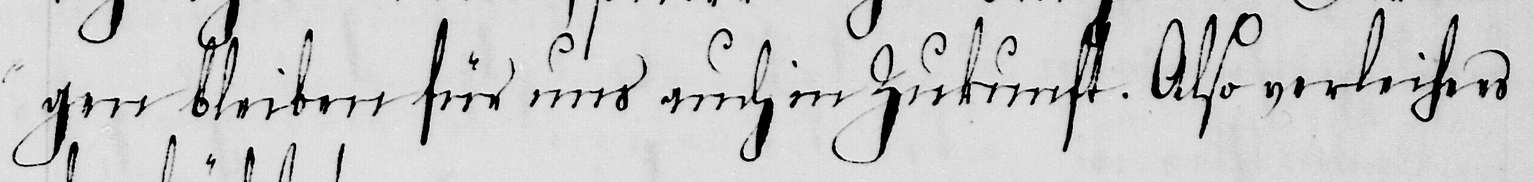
gen bleiben für uns auch in Zukunft. Also verleihe es
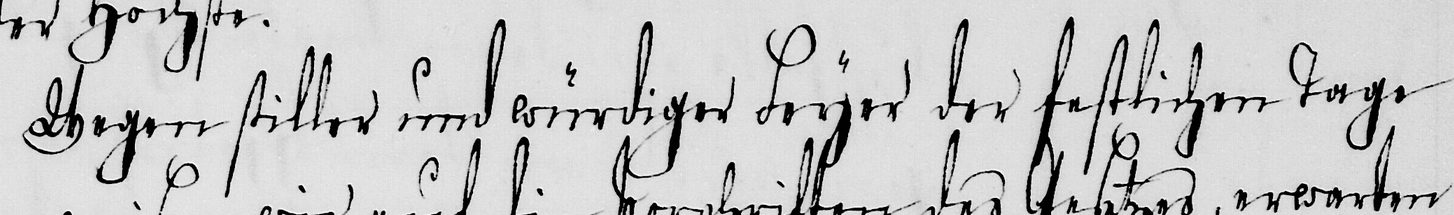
Wegen stiller und würdiger Feyer der festlichen Tage
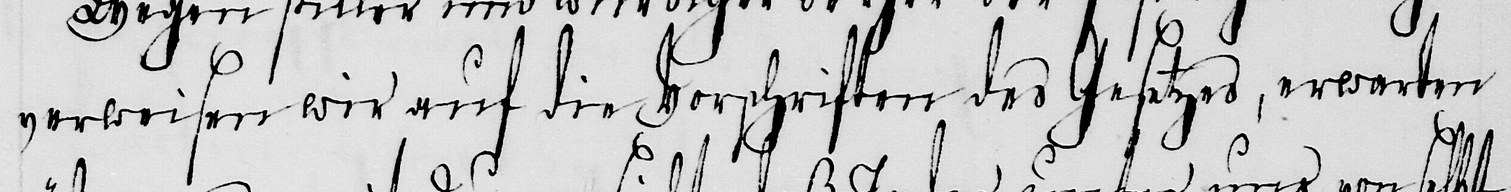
verweisen wir auf die Vorschriften des Gesetzes, erwarten
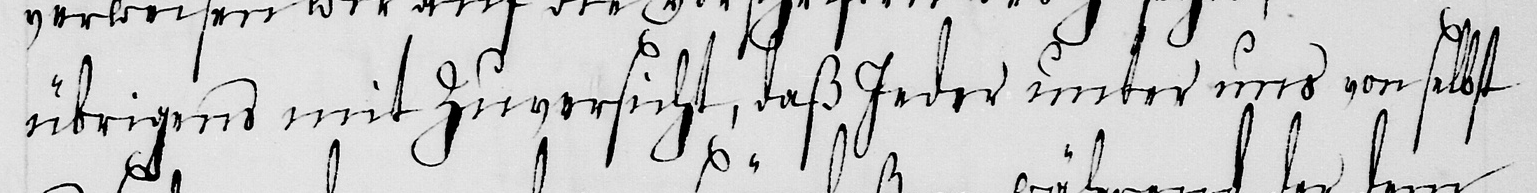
übrigens mit Zuversicht, daß Jeder unter uns von selbst
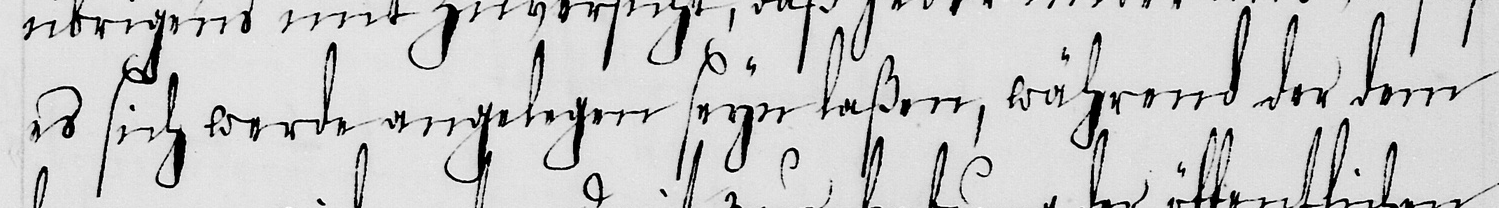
es sich werde angelegen seyn laßen, während der dem
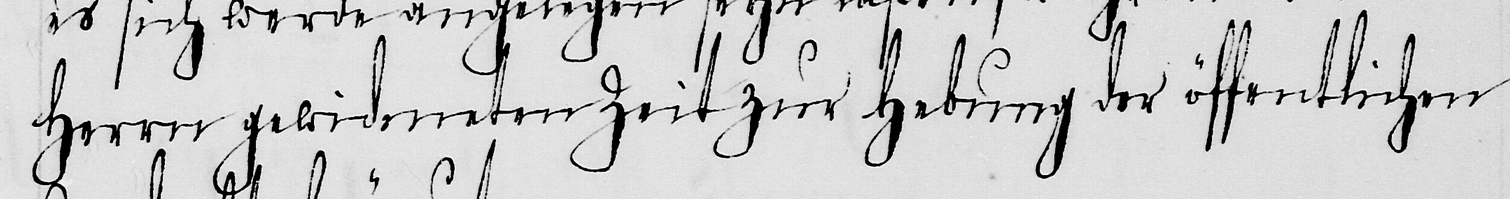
Herrn gewidmeten Zeit zur Hebung der öffentlichen
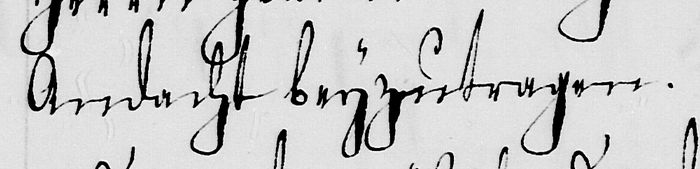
Andacht beyzutragen.
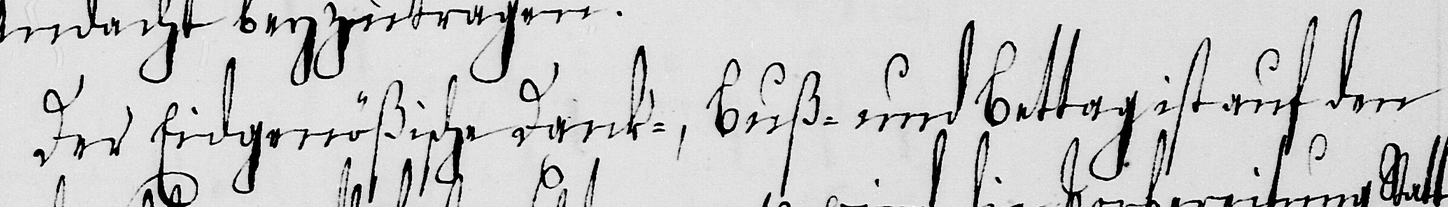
Der Eidgenößische Dank-, Buß- und Bettag ist auf den
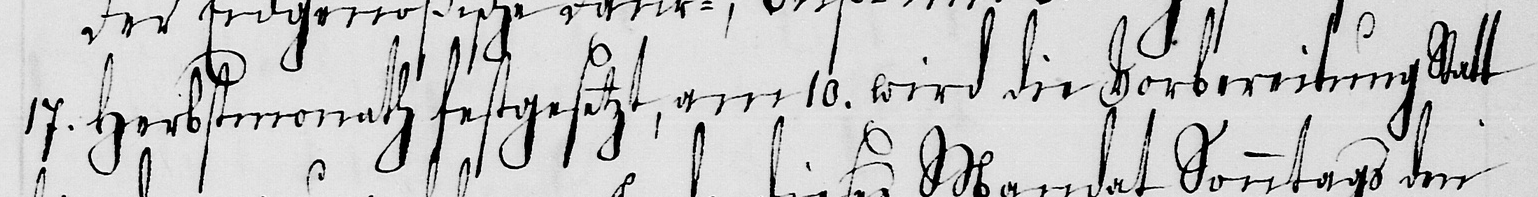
17. Herbstmonath festgesetzt, am 10. wird die Vorbereitung Statt
